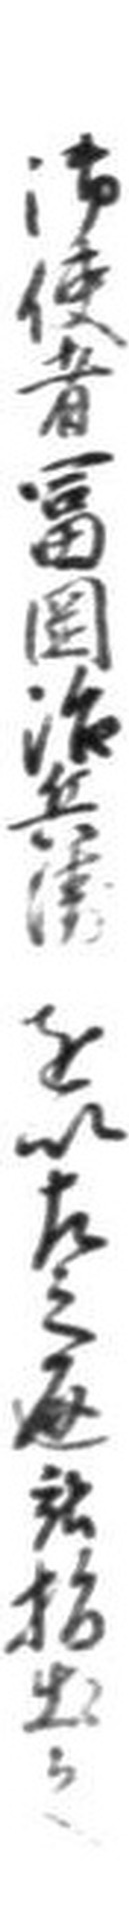御使者富岡治兵衛を以左之通被指出之
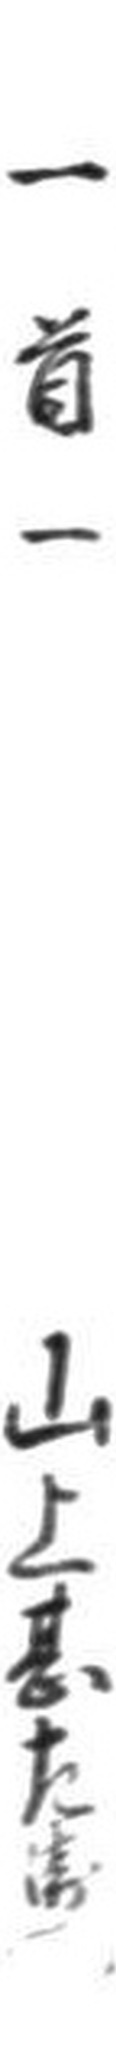一首一山上甚左衛門
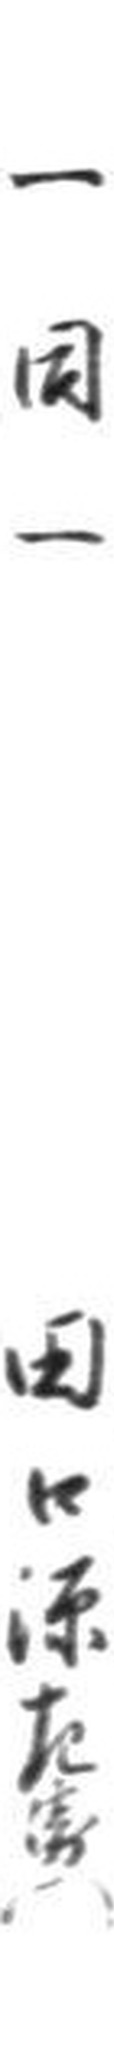一同一田口源左衛門
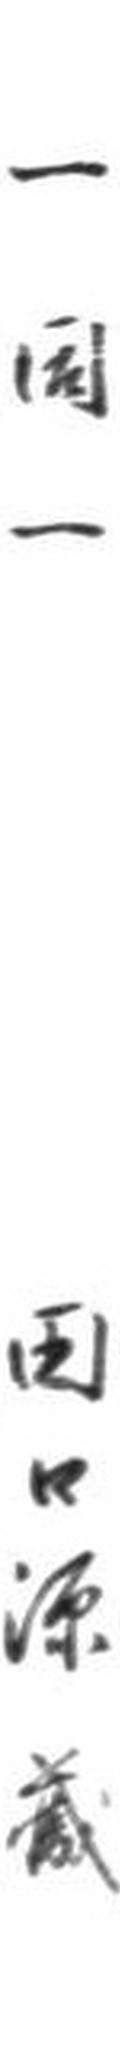一同一田口源蔵
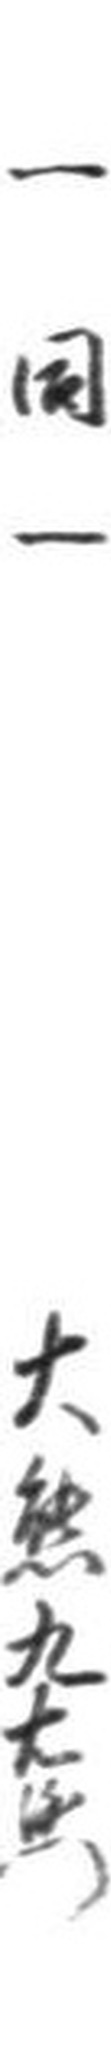一同一大熊九右衛門
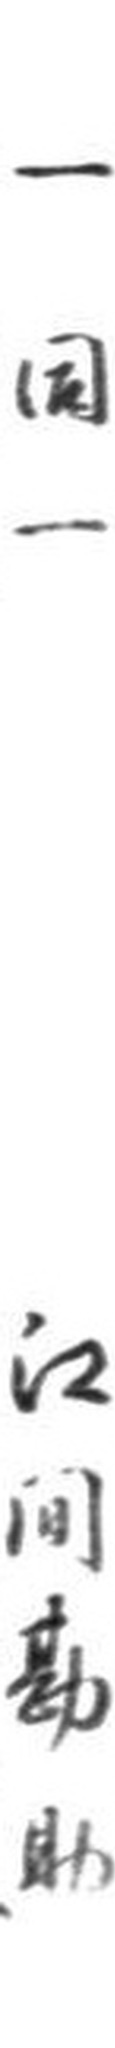一同一江間勘助
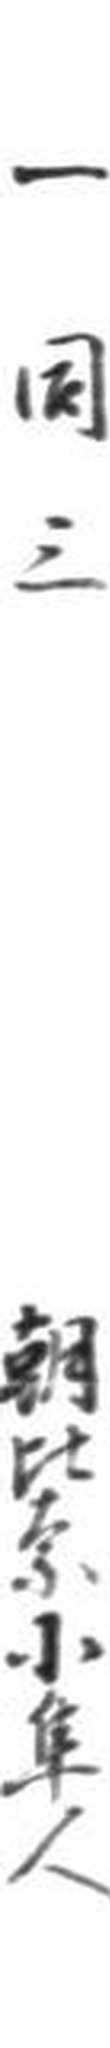一同三朝比奈小隼人
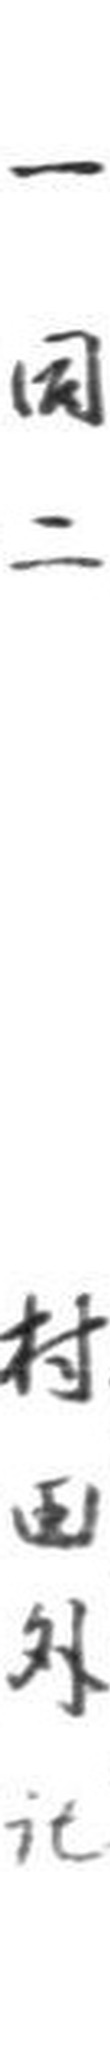一同二村田外記
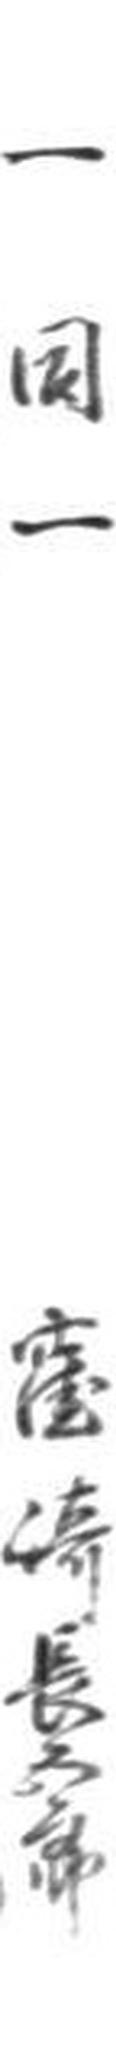一同一窪崎長五郎
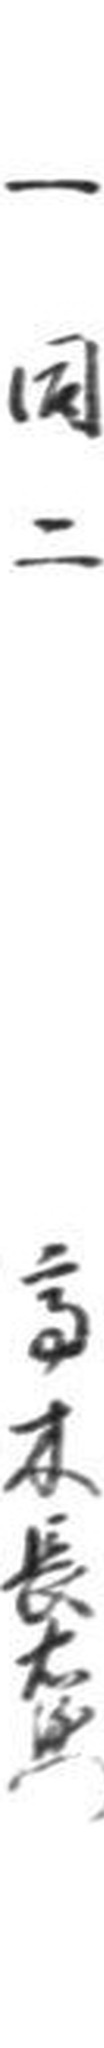一同二高木長右衛門
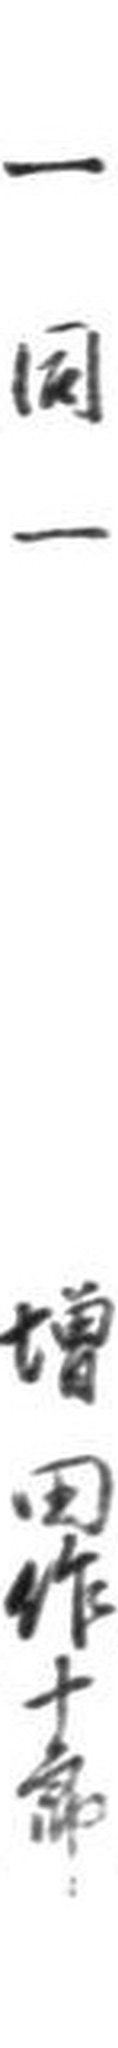一同一増田作十郎

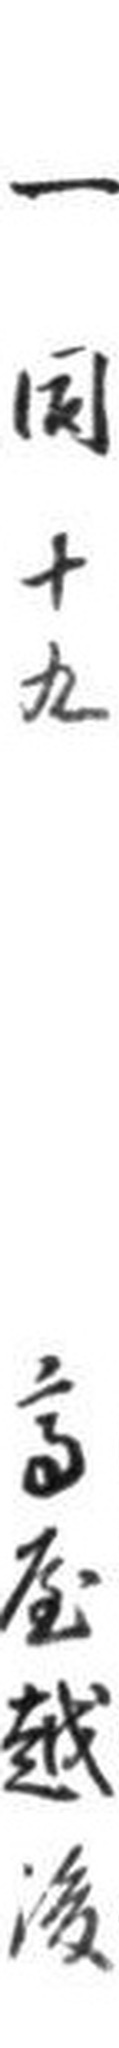一同十九高屋越後
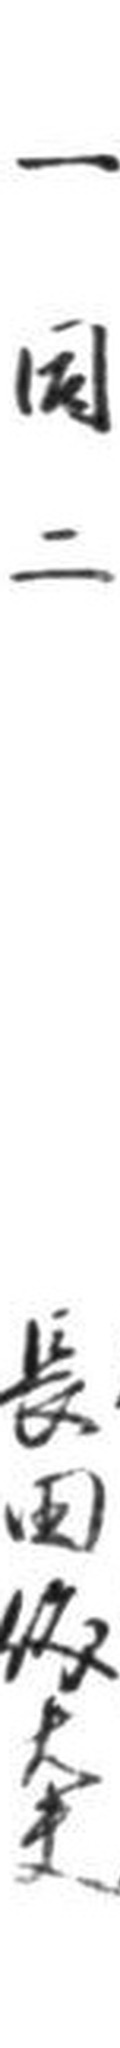一同二長田儀大夫
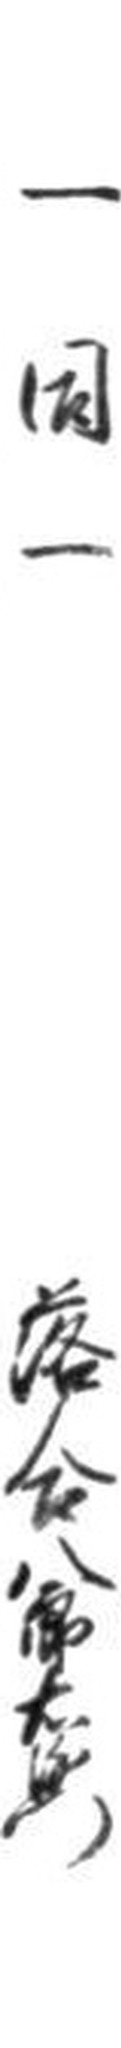一同一落合八郎右衛門
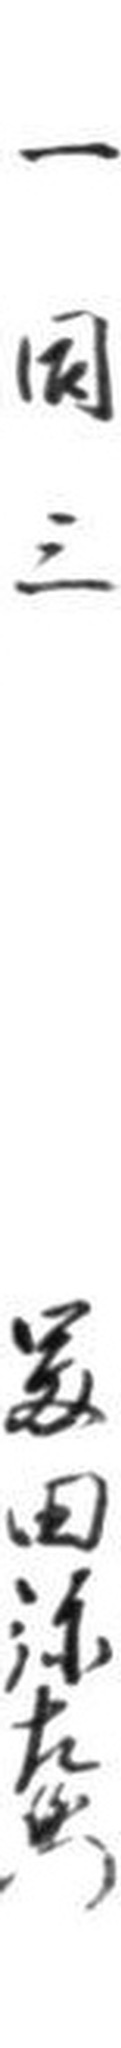一同三富田弥左衛門
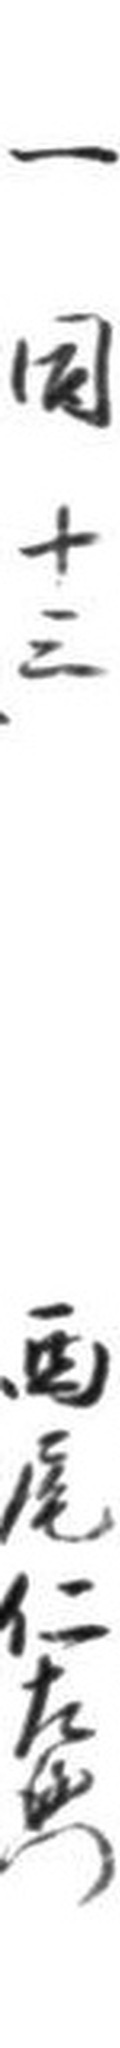一同十三西尾仁左衛門
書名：家譜 二 忠直公 従文禄四年到慶安四年
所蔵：福井県文書館 Fukui Prefectural Archives
